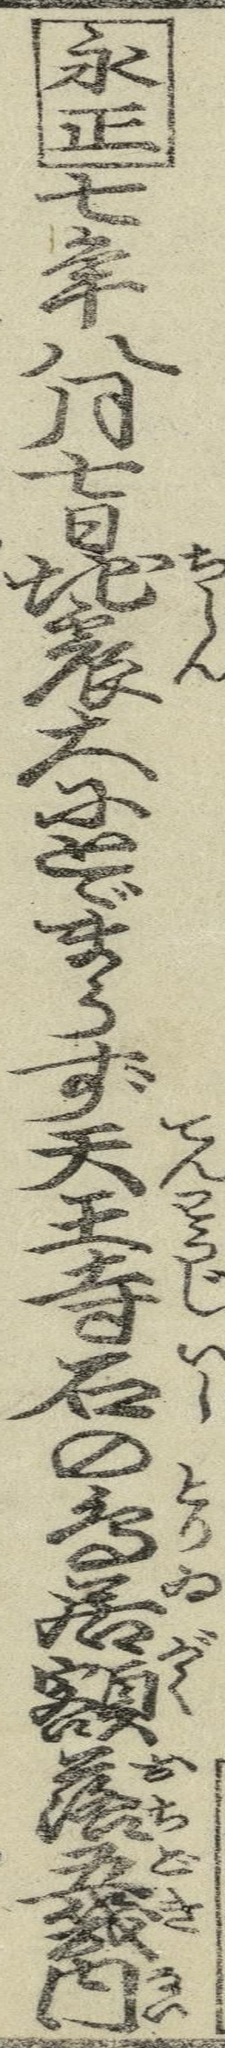永正七年八月七日地震大にとゞまらず天王寺石の鳥居額落五畿内
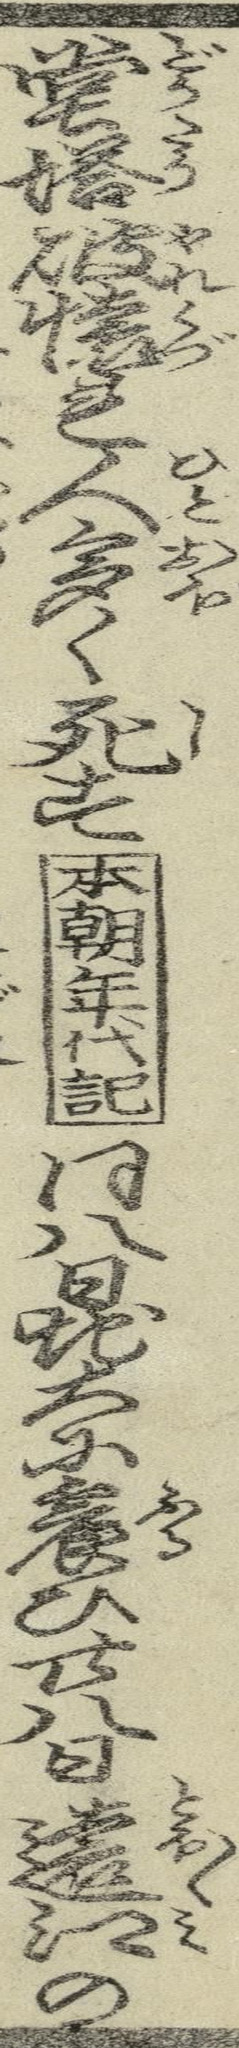堂塔破懐れ人多く死す本朝年代記同八日地大に震ひ廿八日遠江の
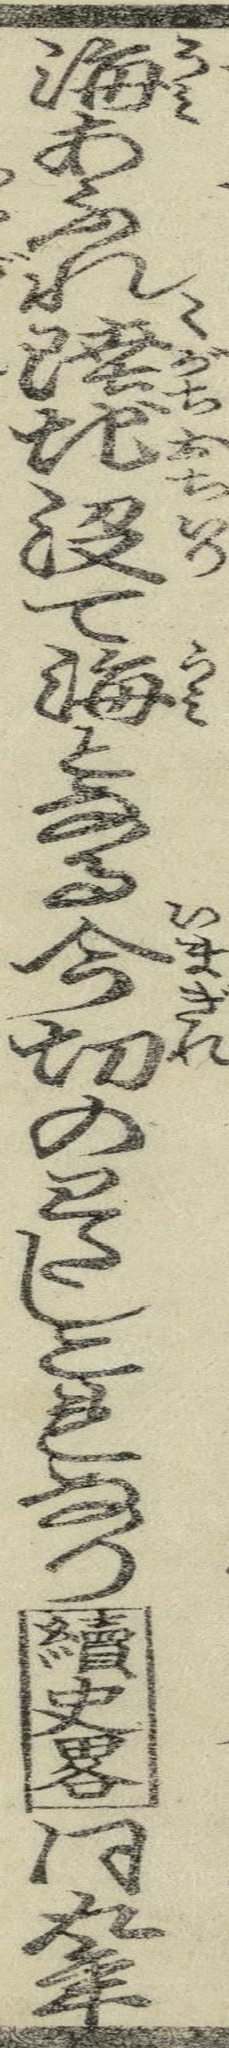海あふれ陸地没て海となる今切のわたしこれなり続史略同九年
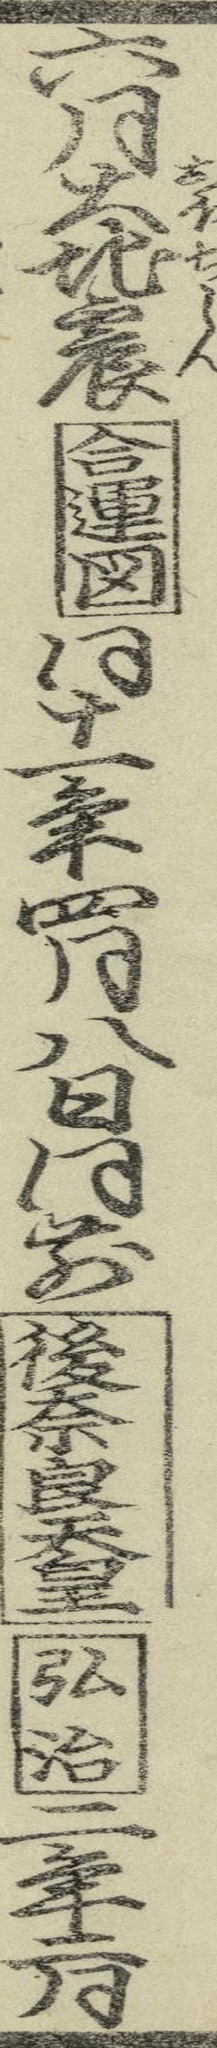六月大地震合運図同十一年四月八日同前後奈良天皇弘治二年二月
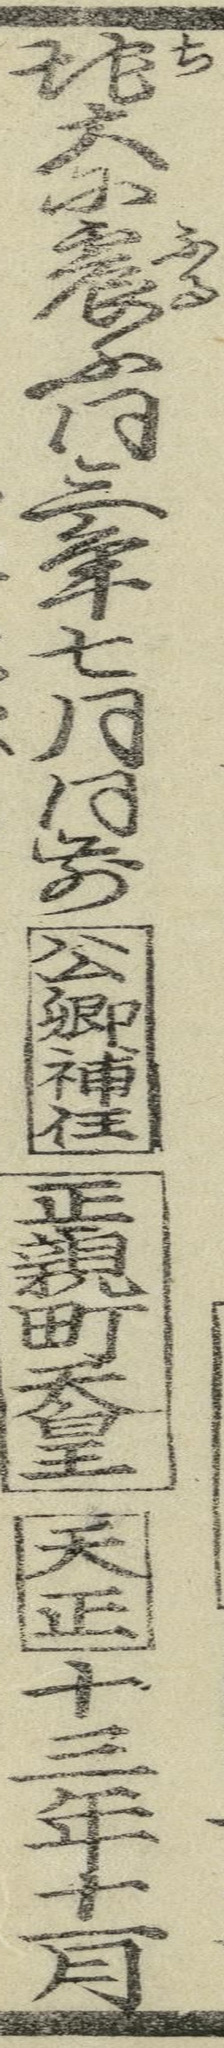地大に震ふ同三年七月同前公卿補任正親町天皇天正十三年十一月
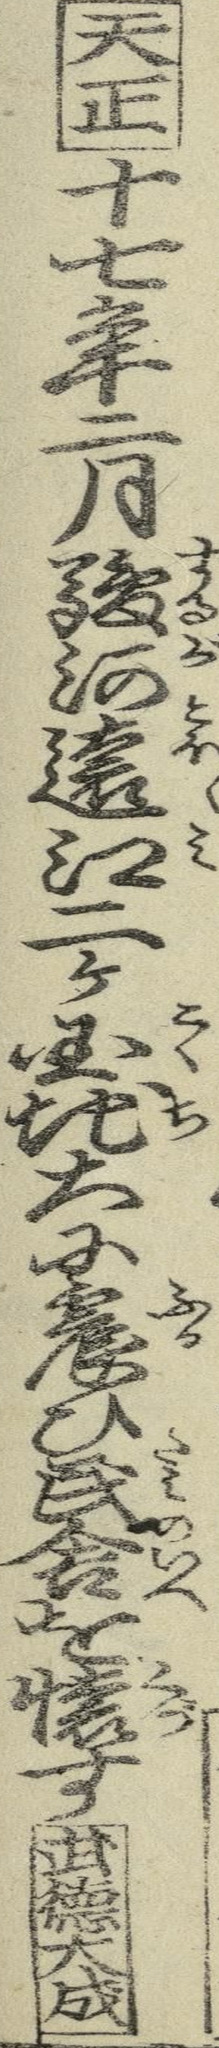天正十七年二月駿河遠江二ケ国地大に震ひ民舎を懐す武徳大成
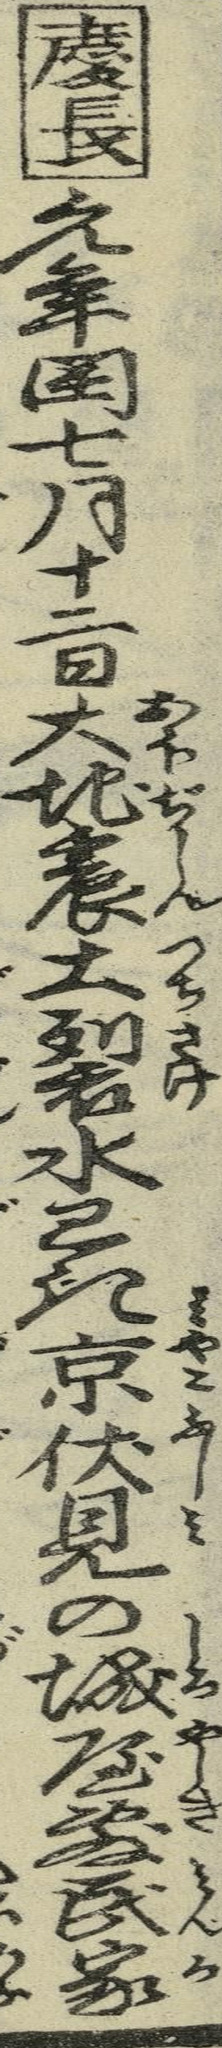慶長元年閏七月十二日大地震土裂水わき京伏見の城屋敷民家
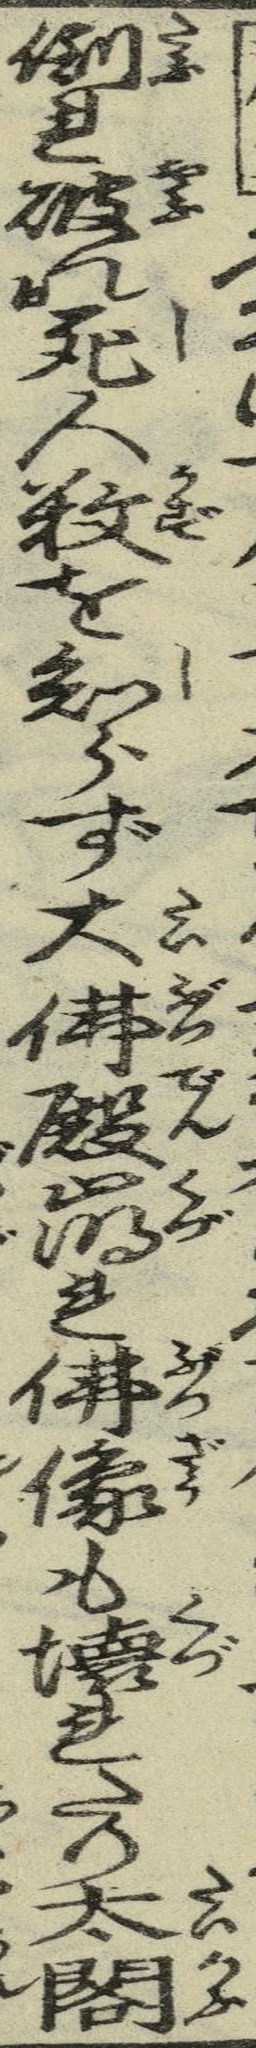倒れ破れ死人数を知らず大仏殿崩れ仏像も壊れたり太閤
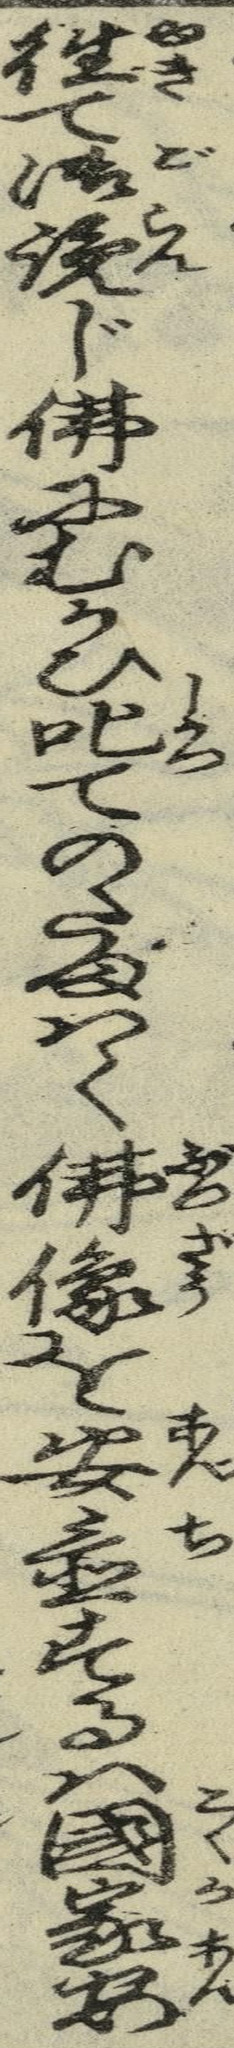往て御覧じ仏にむかひ叱てのたまはく仏像を安置するは国家安
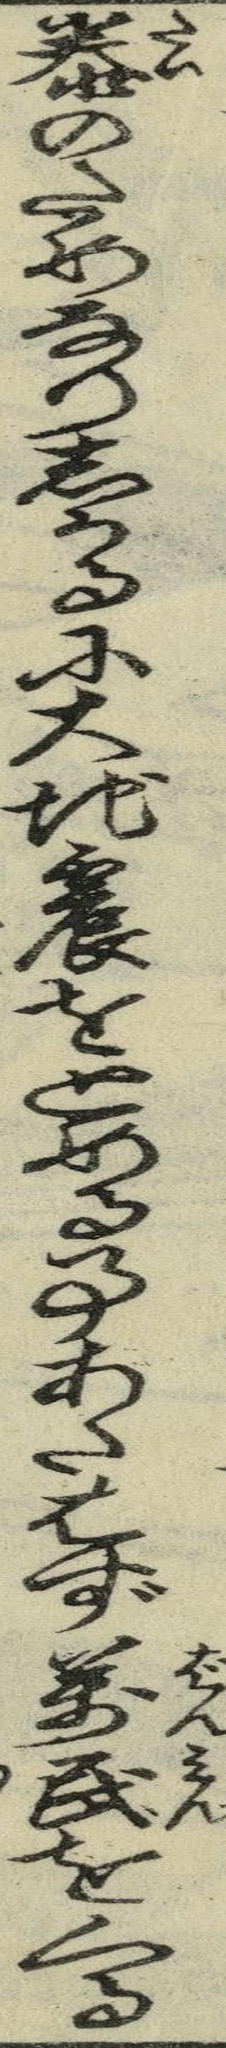泰のためなりしかるに大地震をとめる事あたはず万民をくる
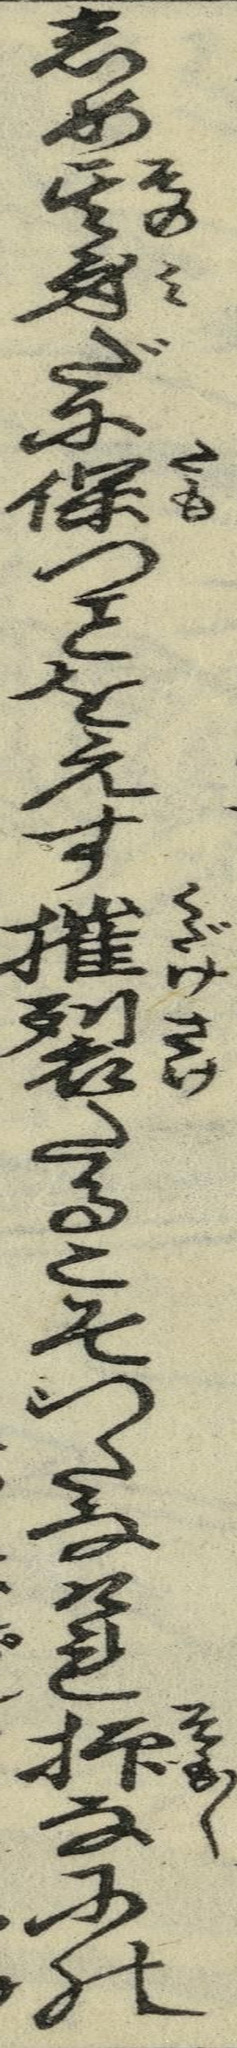しめ其身だに保つことをえす摧裂たるこそつたなけれ抑なにの
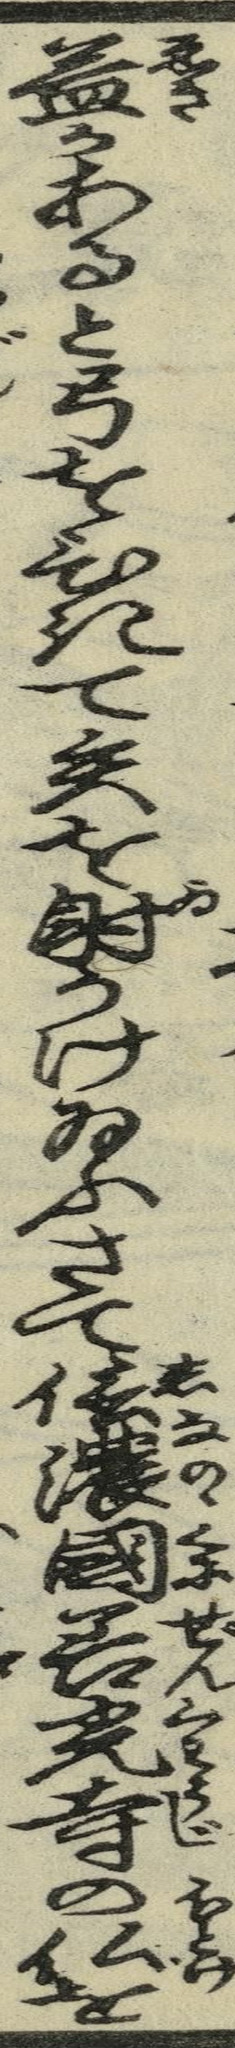益かあると弓をひきて矢を射かけ給ふさて信濃国善光寺の仏を
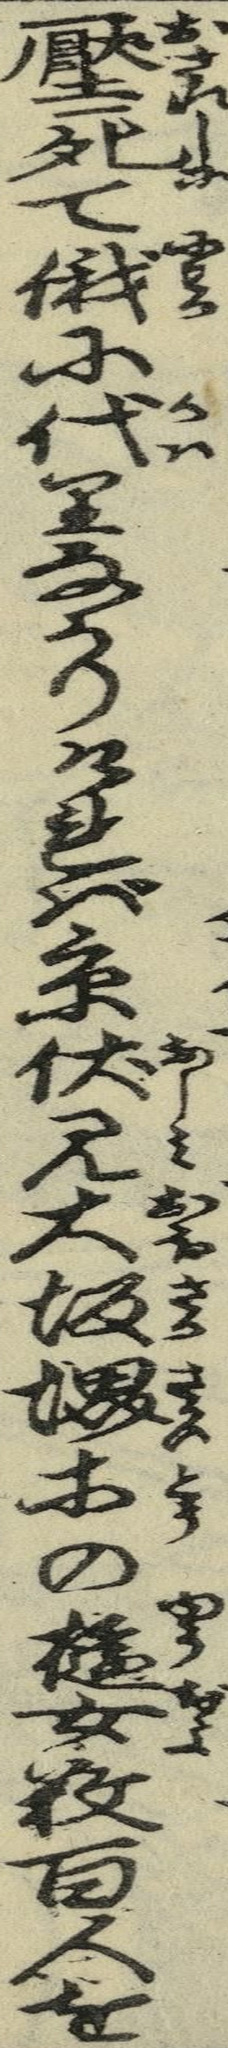圧死て俄に代りなかりければ京伏見大坂堺等の遊女数百人を
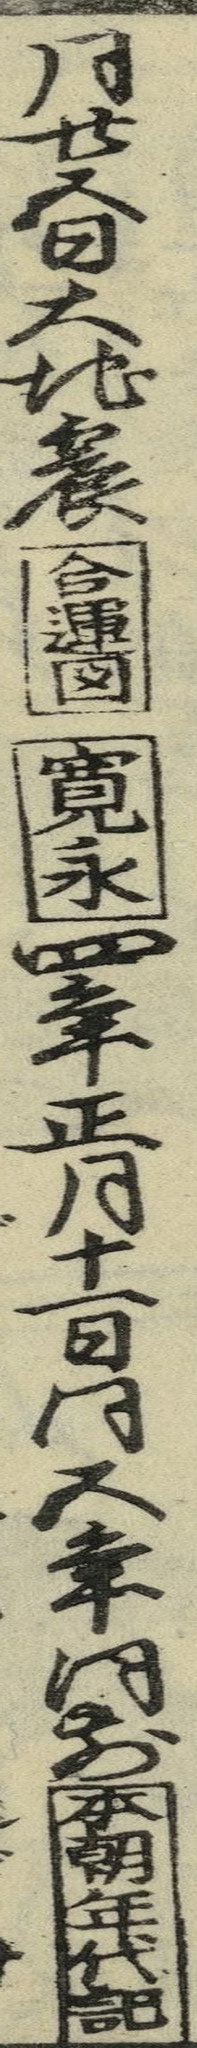月廿五日大地震合運図寛永四年正月十一日同五年同前本朝年代記
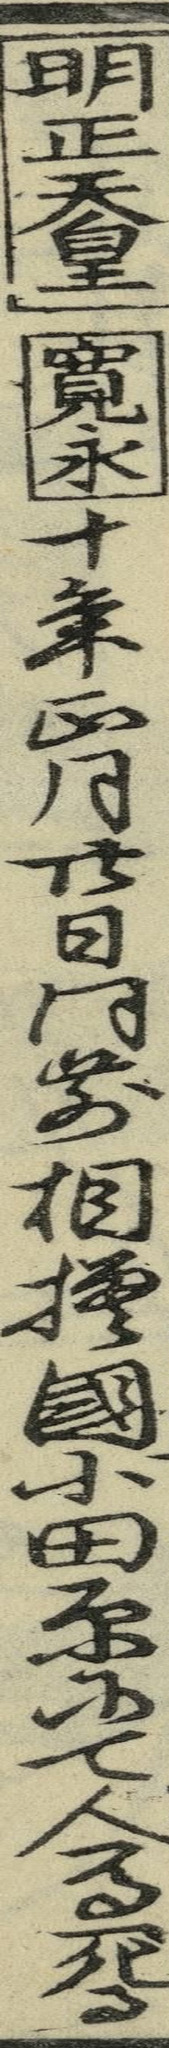明正天皇寛永十年正月廿日同前相模国小田原にて人馬死る

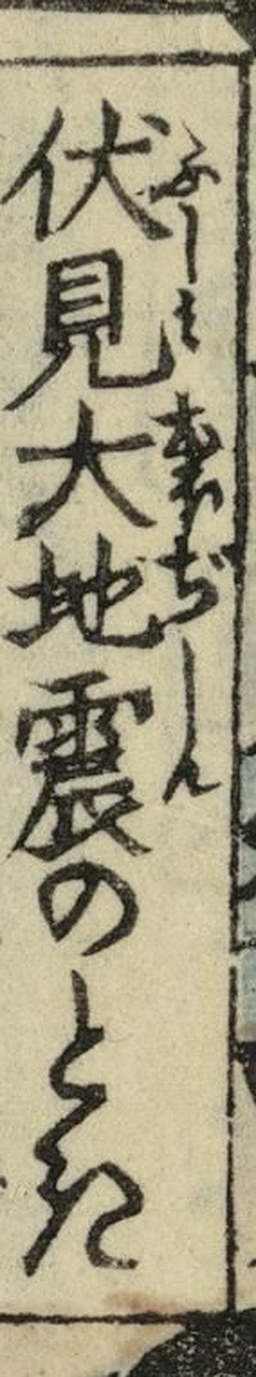伏見大地震のとき
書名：地震年代記
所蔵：東京大学地震研究所図書室 Earthquake Research Institute Library, The University of Tokyo, JAPAN
